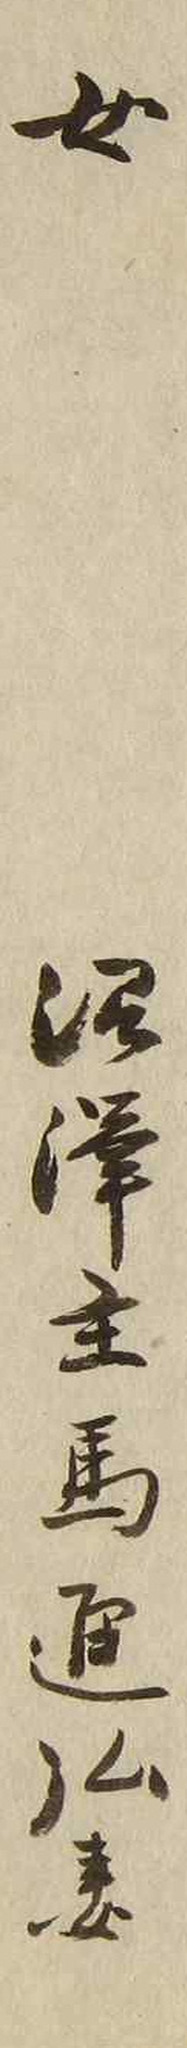女沼沢主馬通弘妻
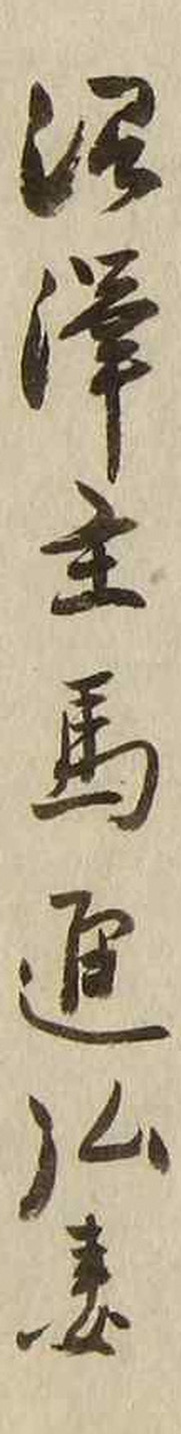女沼沢主馬通弘妻

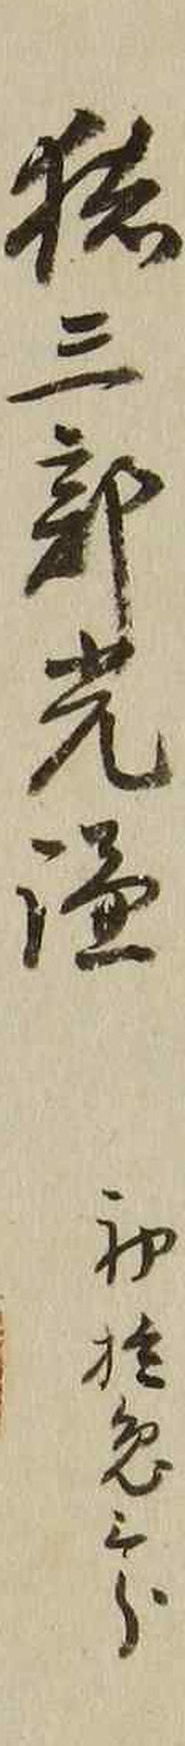猪三郎光謙初権兎三郎
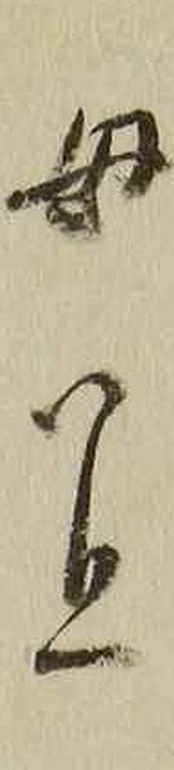母同上
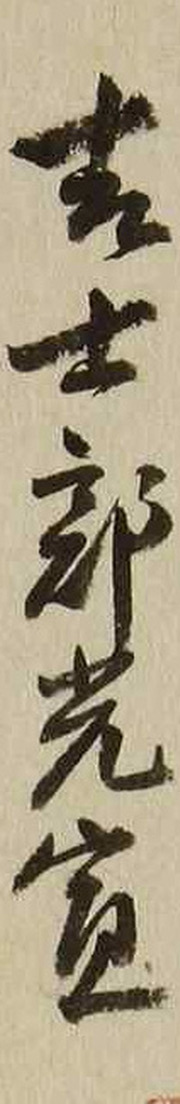吉士郎光宣
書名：諸士系譜　巻之269　さ之部1
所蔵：会津若松市立会津図書館
